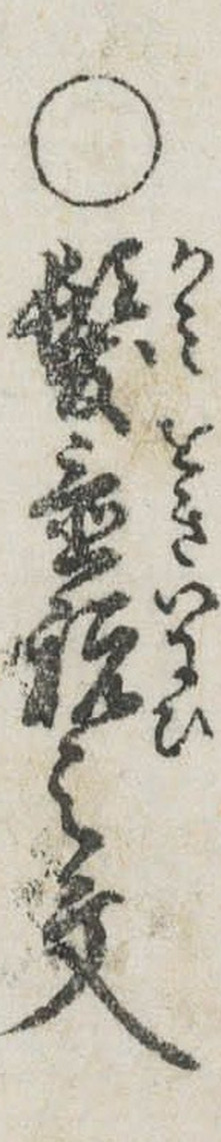○髪置祝之文
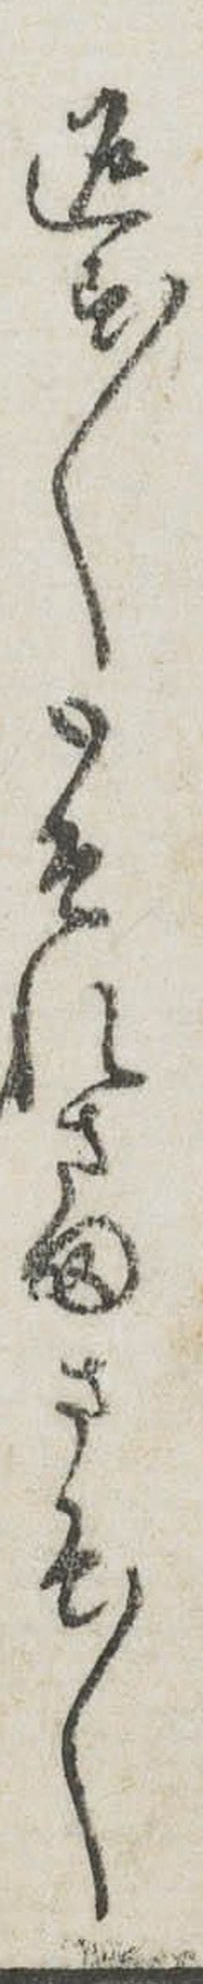返す〳〵御それさまさそ〳〵
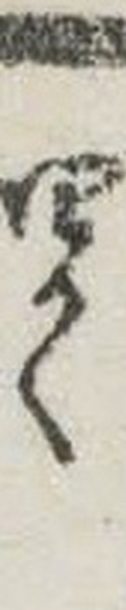四かく
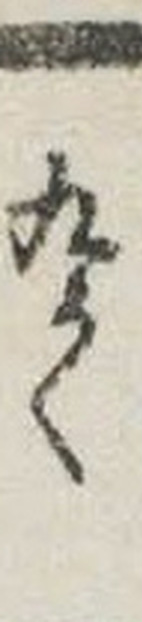九かく
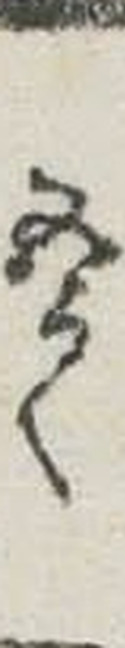五かく
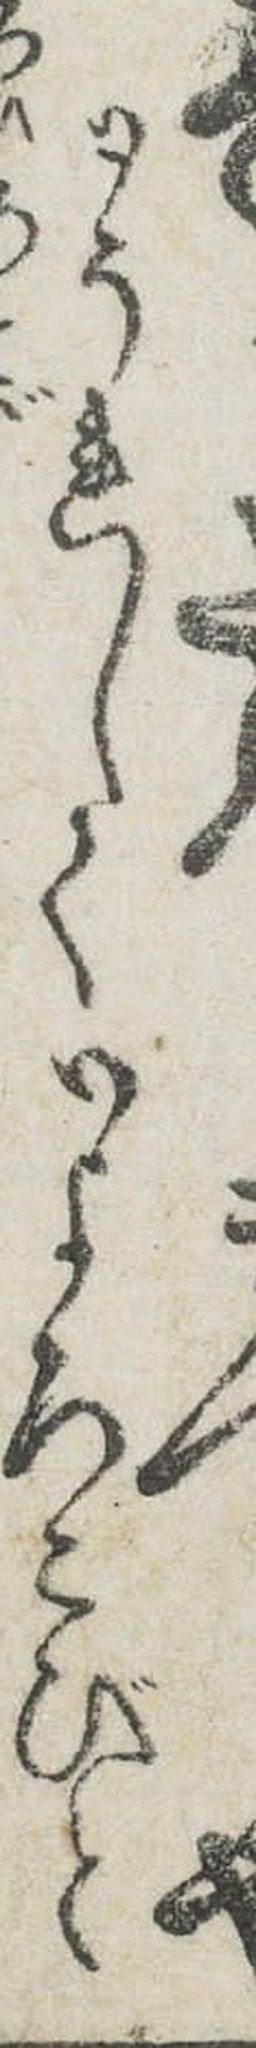御うれしく御よろこびと
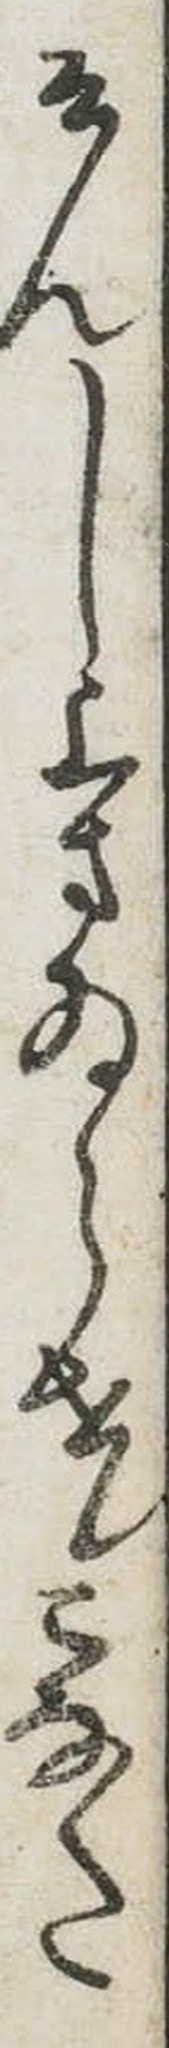そんし上まゐらせ候こなた
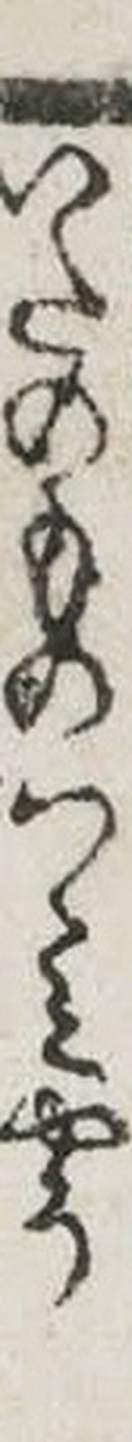いたものつゝみやう
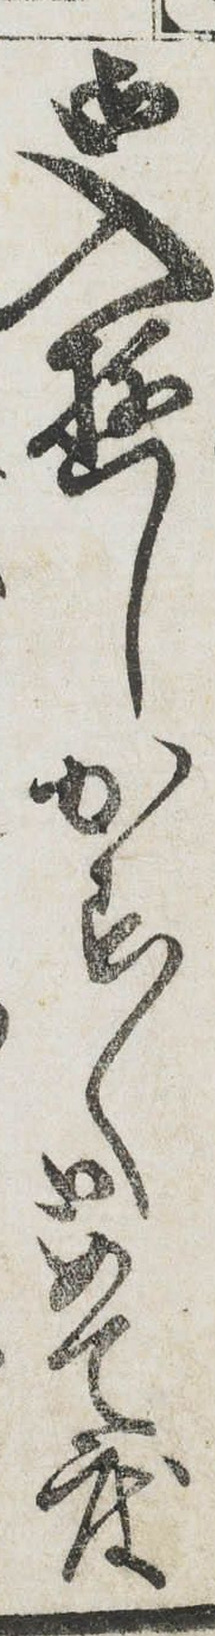御入遊しかす〳〵御めて度
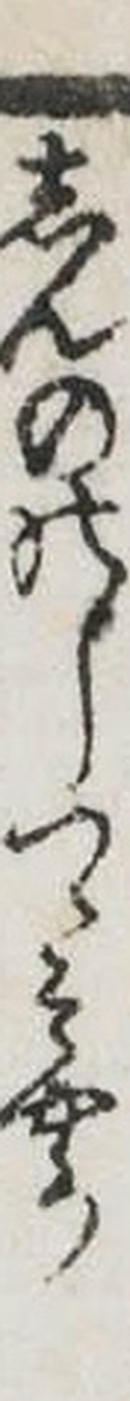しんののしつゝみやう
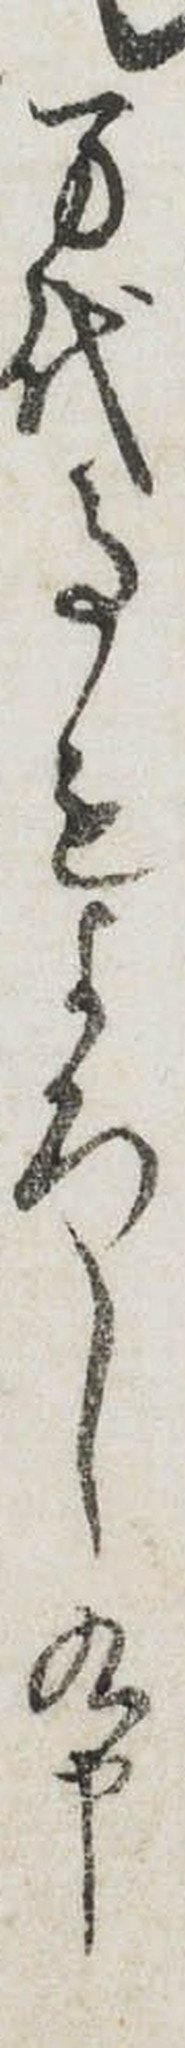万代事もよろしく申
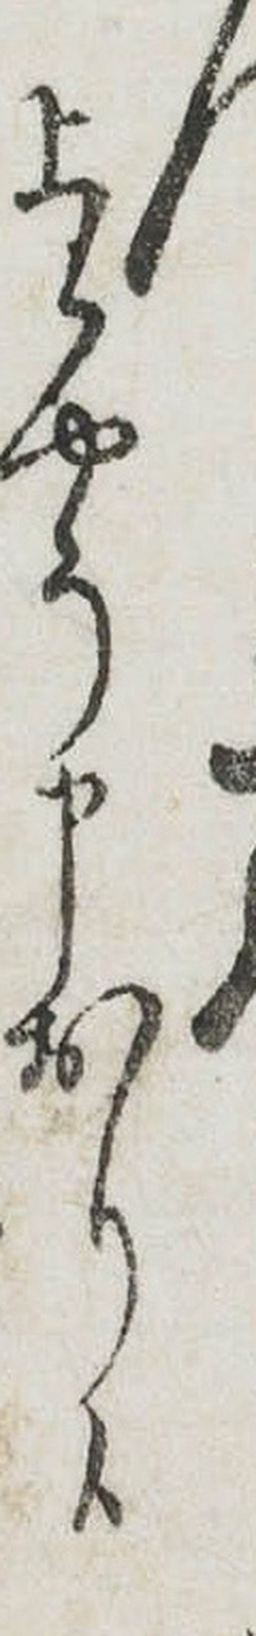上候やう申おり候
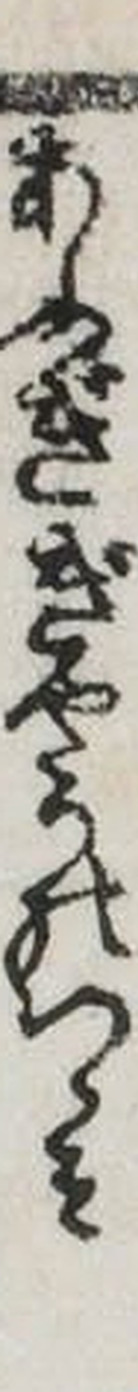あふぎぎやうのつゝみ
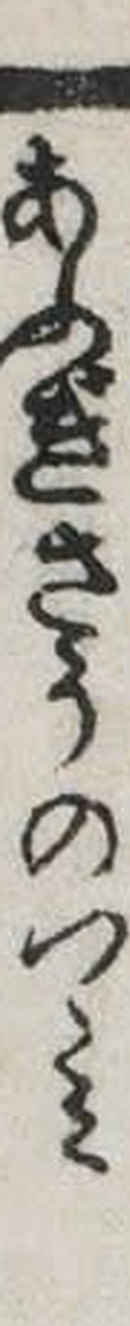あふきさうのつゝみ

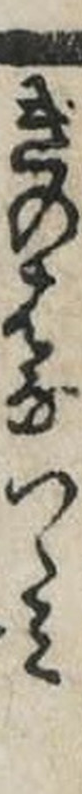きのはなつゝみ
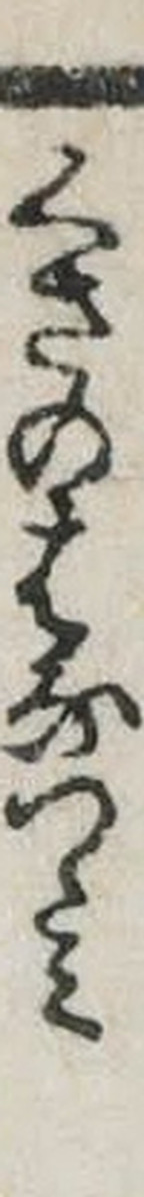くさのはなつゝみ
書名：頭書萬用婦人手紙之文言
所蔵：東京学芸大学教育コンテンツアーカイブ
